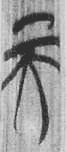而
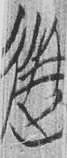迸
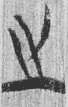之
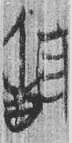○（聞）
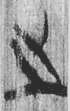之
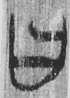曰
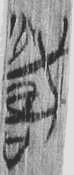○（察）
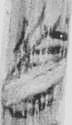道
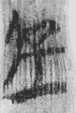坐
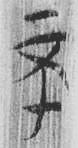不
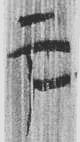下
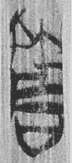○（席）
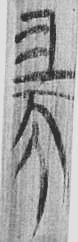耑
